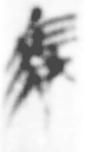駟
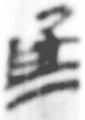爲
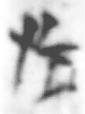○（左）
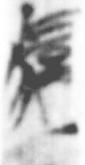驂
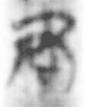君
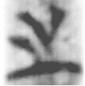之
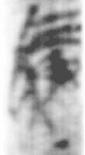駟
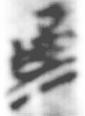爲
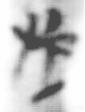○（左）
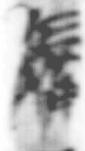○（服）
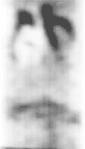北
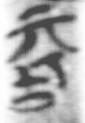坪
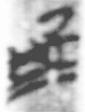爲
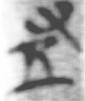○（右）
